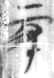亥
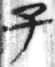子
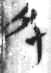丑
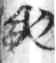寅
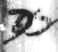卯
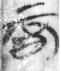晨
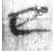巳
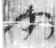午
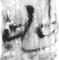申
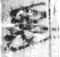是
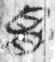{胃刀}（謂）
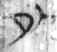外
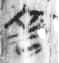害
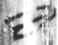日
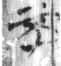不
